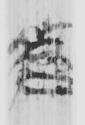﨤
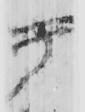于
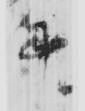身
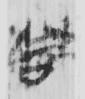㕨
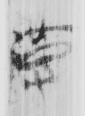皮
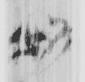{少刀}
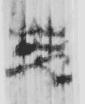{土丰}
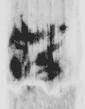{爿戈口}
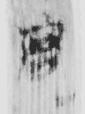君
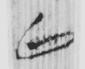㠯（以）
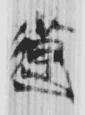﨤
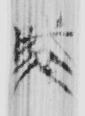{衣戌}
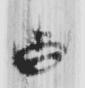由
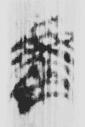虛
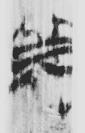丘
